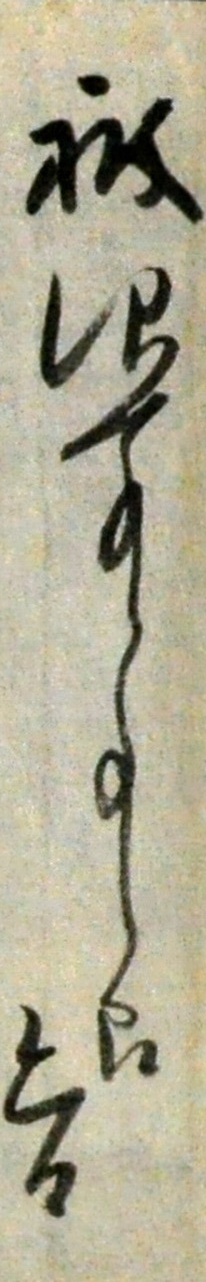被仰聞事候間今日
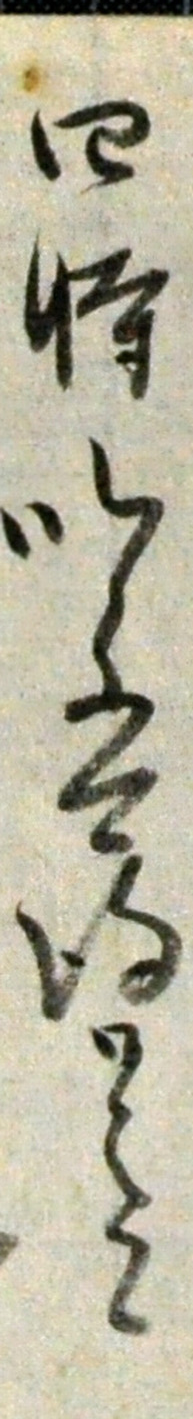四時以参可得御意候
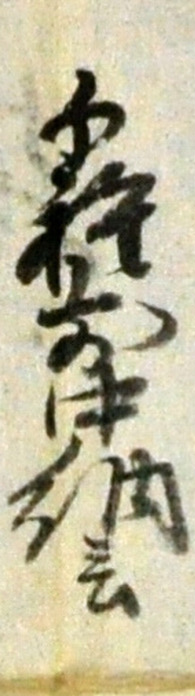千種前中納言
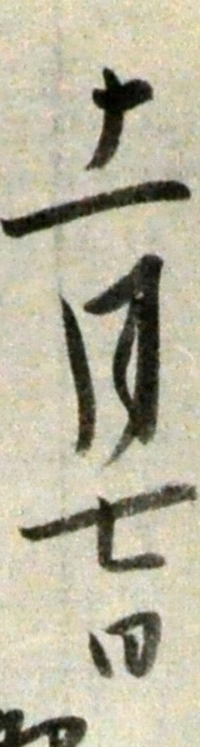十一月七日
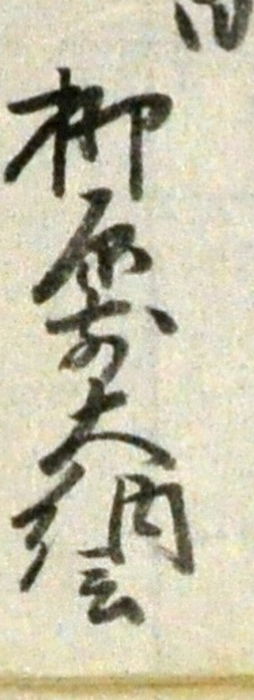柳原前大納言
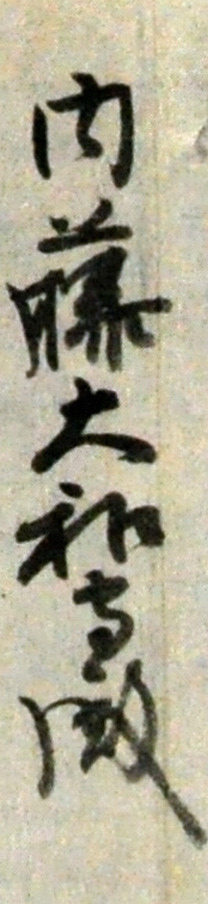内藤大和守殿
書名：書状
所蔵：伊那市立高遠町図書館・合同会社AMANE
